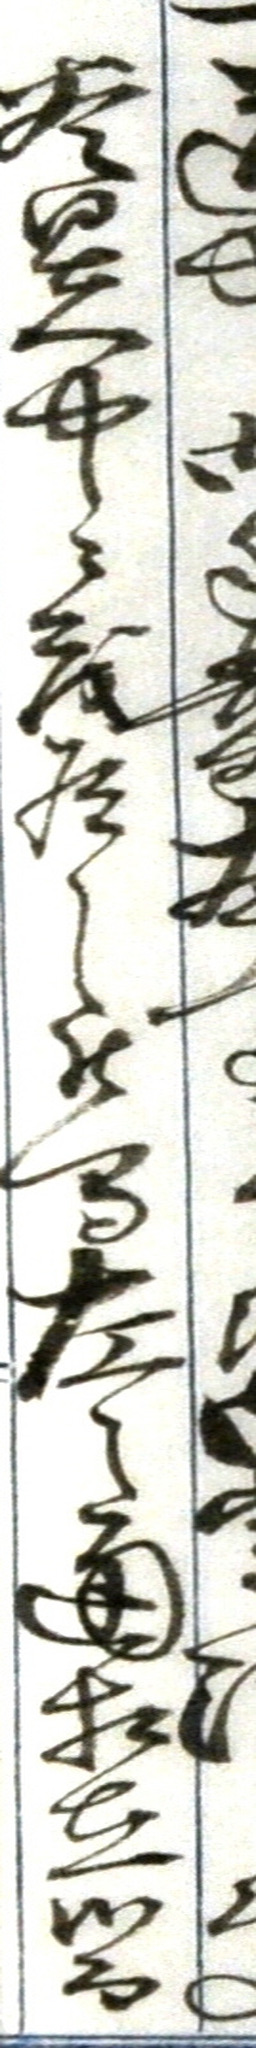炎暑中にも有之候間左之通相立候而

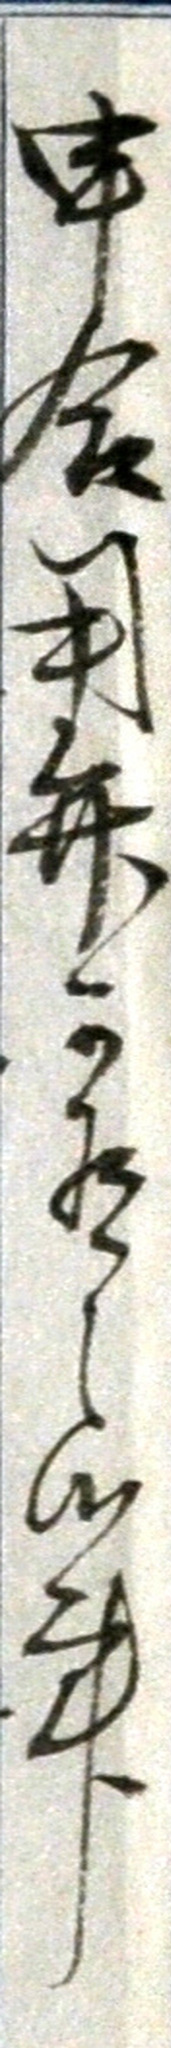申合用弁可有之候事
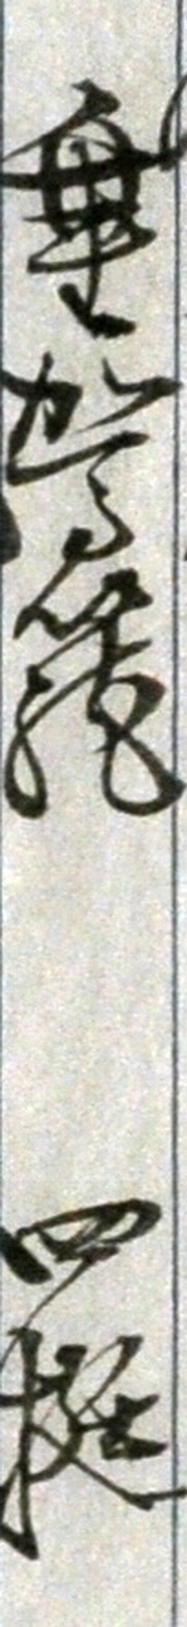垂駕籠四挺
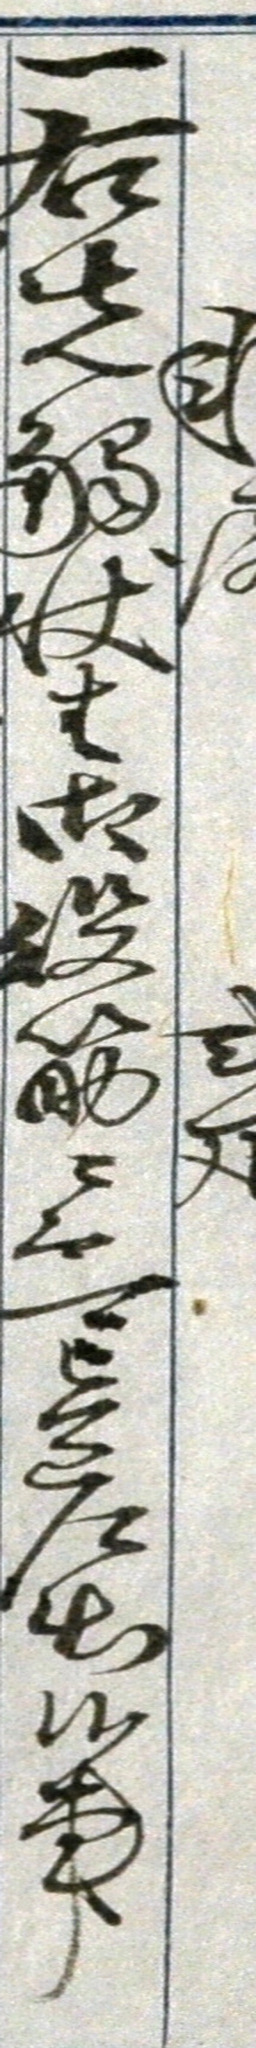一右先触状は御役筋に而可被差出候事
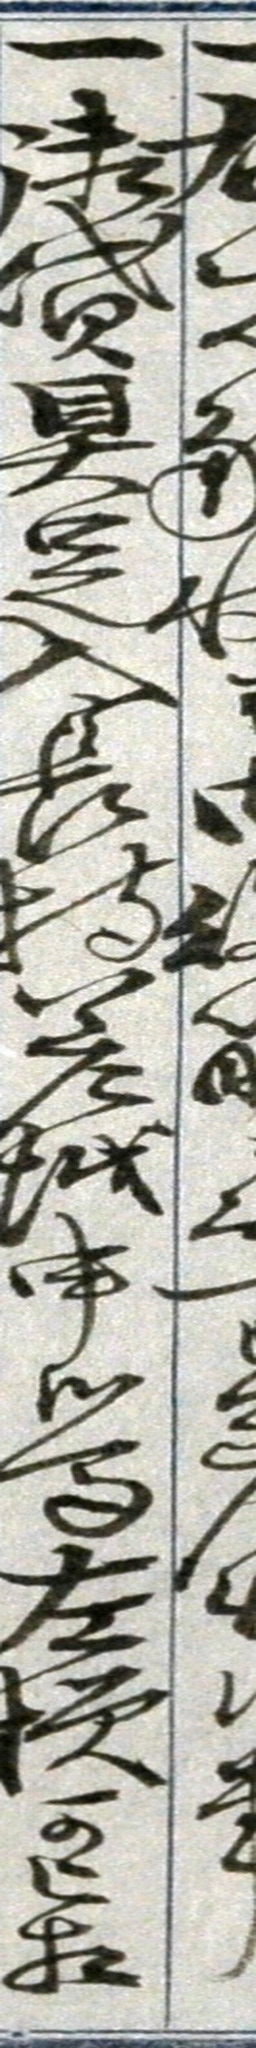一御貸具足入長持差越申候間左様可被相
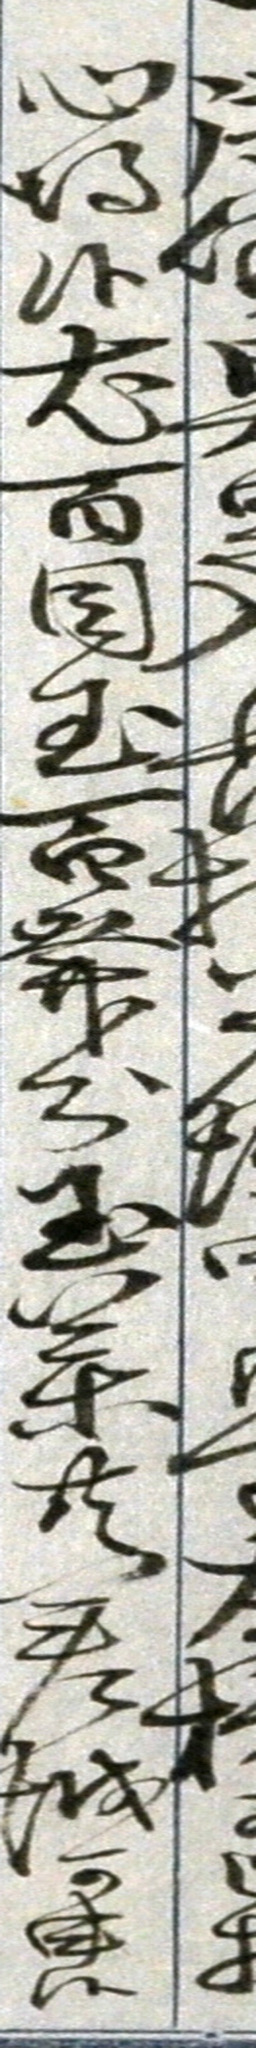心得候尤百目玉百発分玉薬共以差越可申候
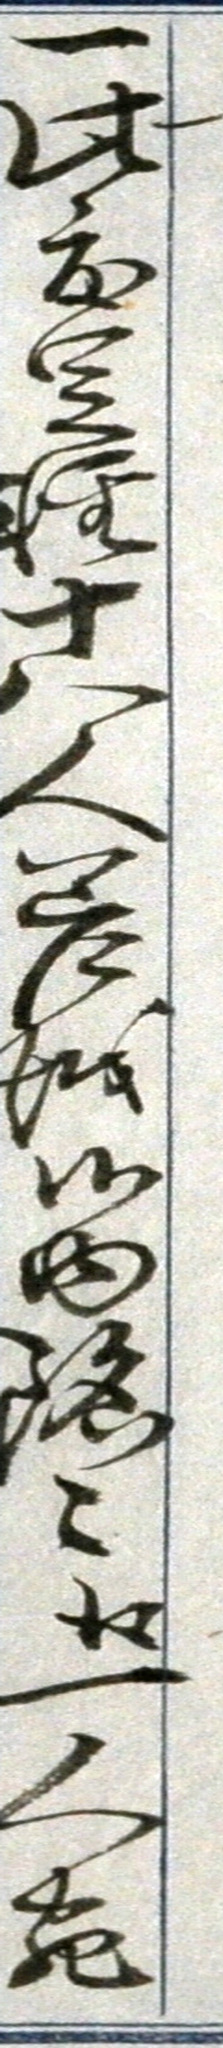一此度足軽十八人差越候内銘々え一人宛
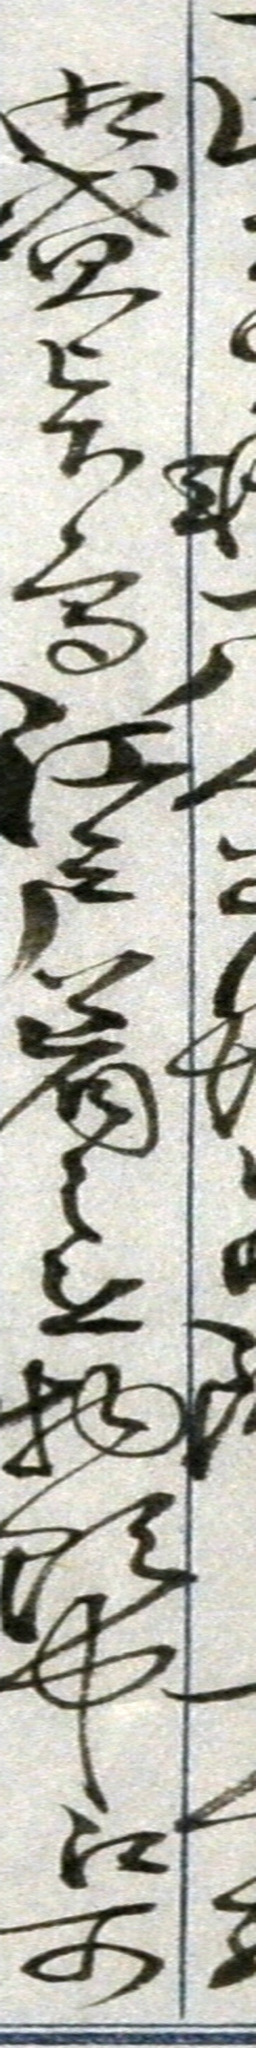御貸被下候間江戸着之上物頭中え可
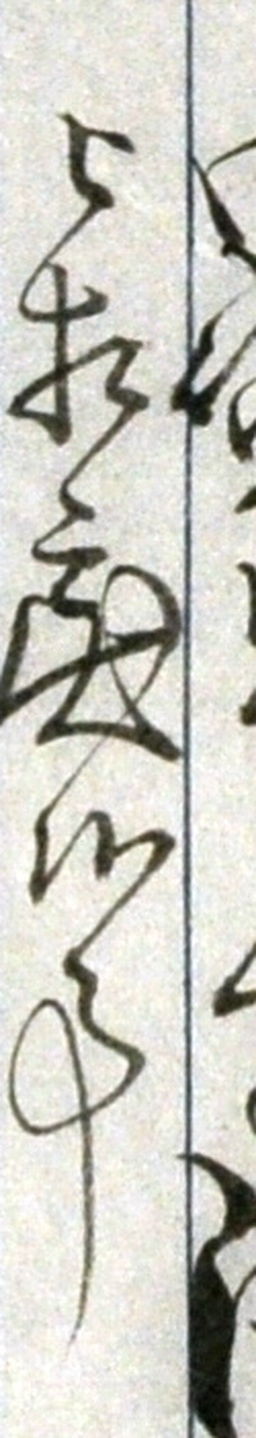被相戻候事
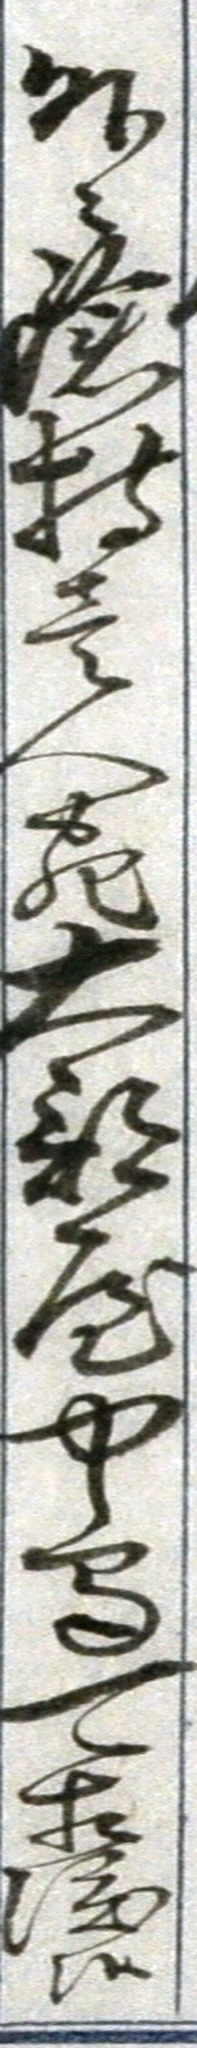外に鎗持壱人宛大部屋中間可相渡候
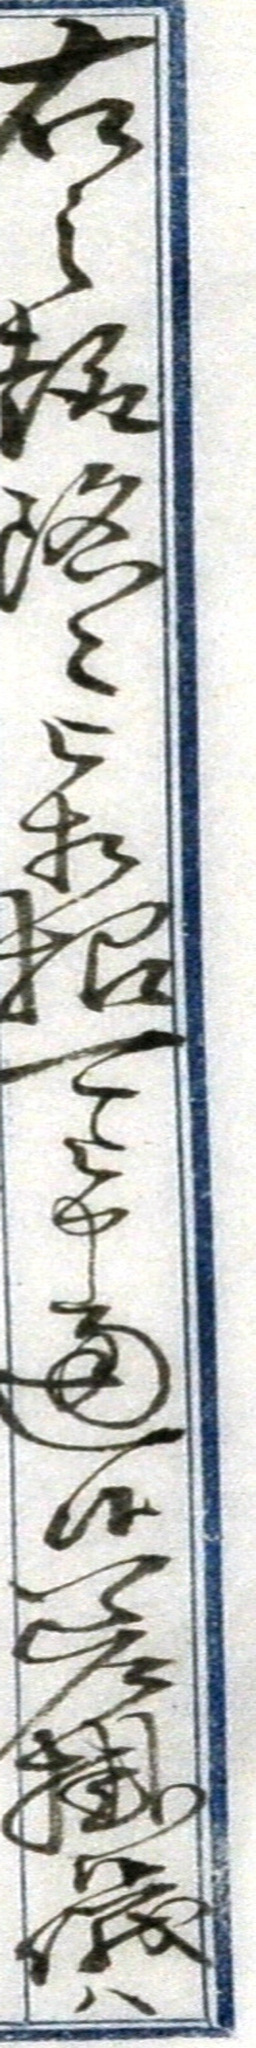右之趣銘々被相招可被申通候差掛候儀は
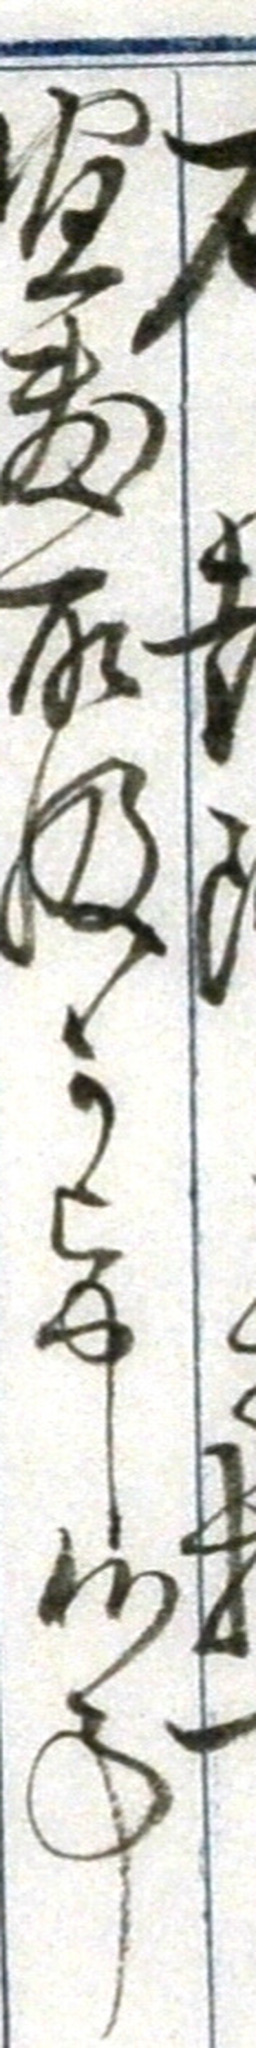宜敷取扱可被申候事
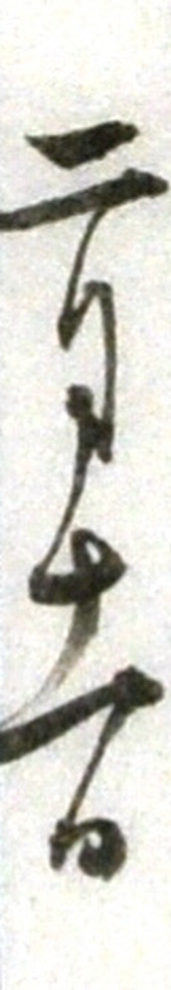二月十一日

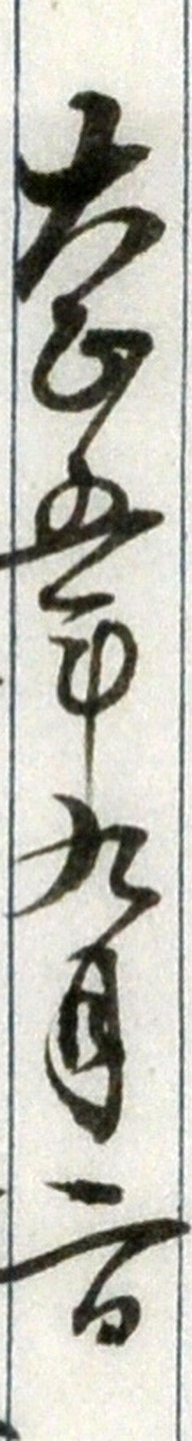大正五年九月二日
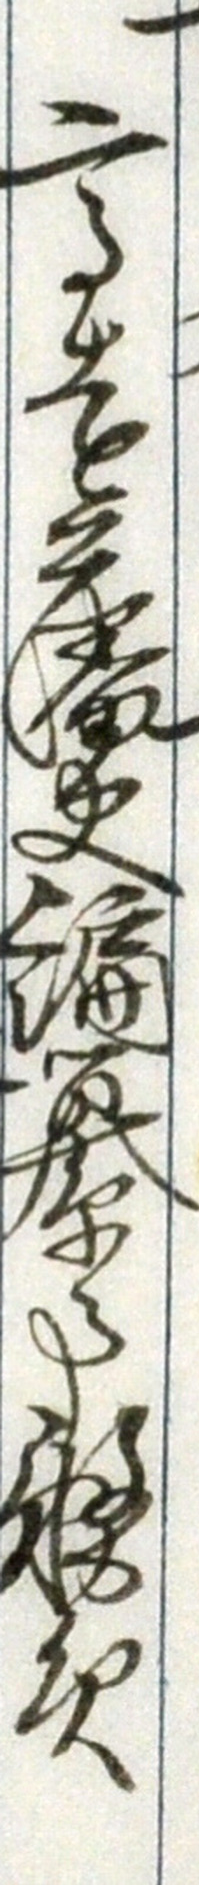高遠藩史編纂事務員
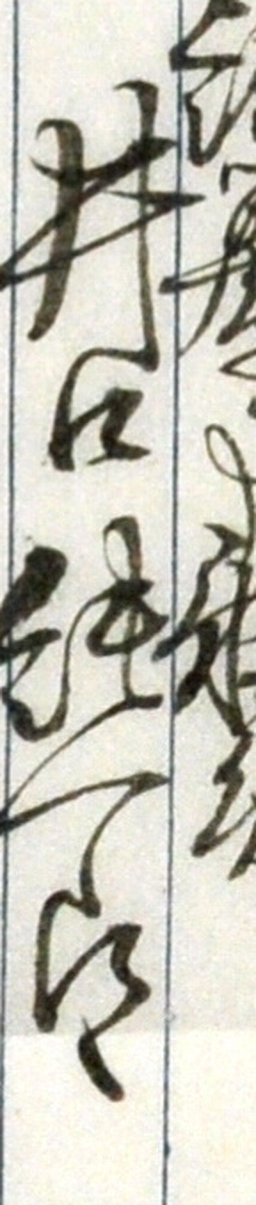井口純一郎
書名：異国船相州浦賀ニ相見エ候節大目付ヘ被仰出候覚書
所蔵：伊那市立高遠町図書館・合同会社AMANE
